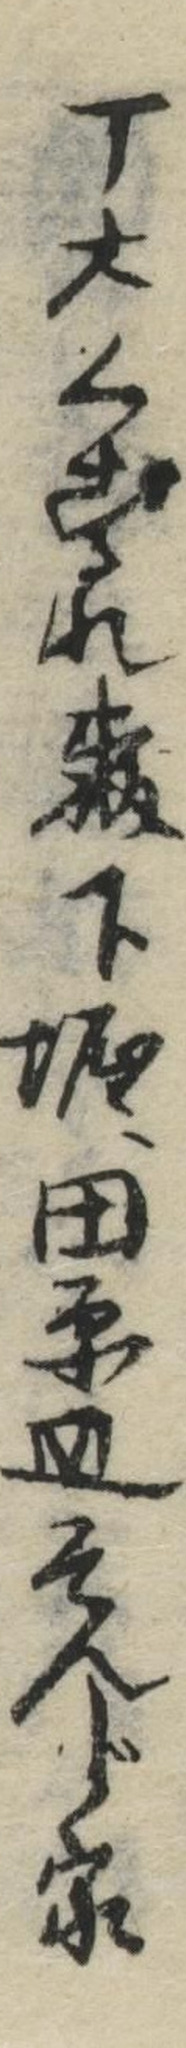丁大くこわれ森下堀田原辺そんじ家
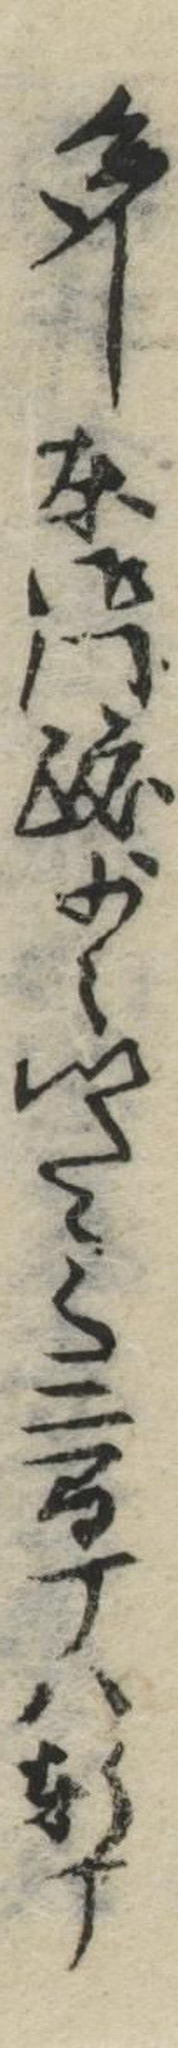多し東御門跡少々いたミ三間丁八軒丁
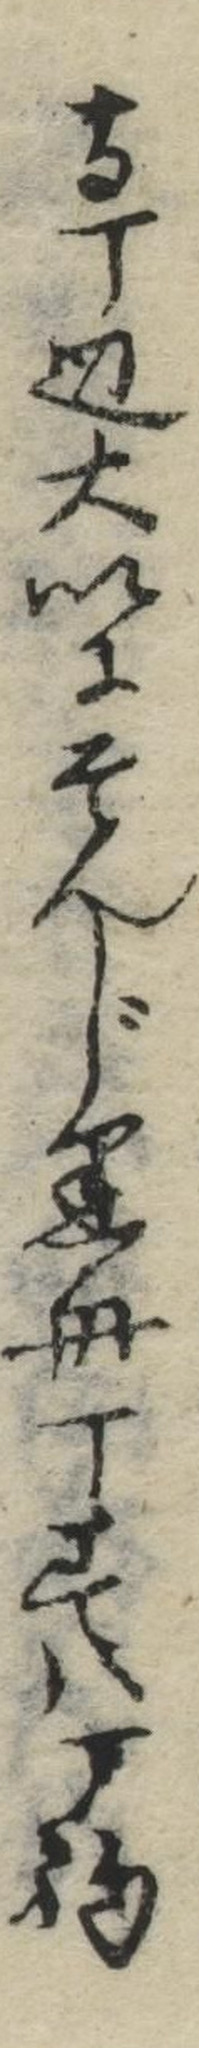寺丁辺大いにそんじ黒舟丁すハ丁駒
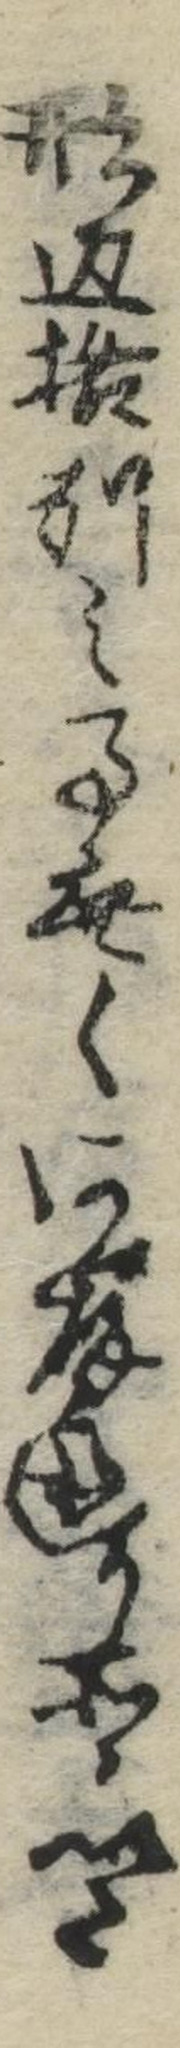形辺格別之事無河岸通り所々いた
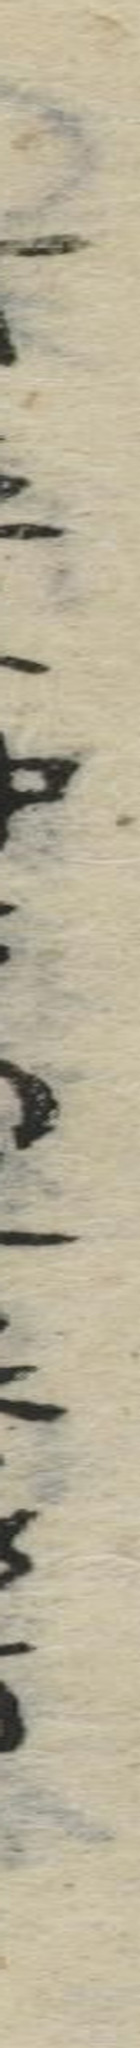ミ有並木仲まち辺崩家有之

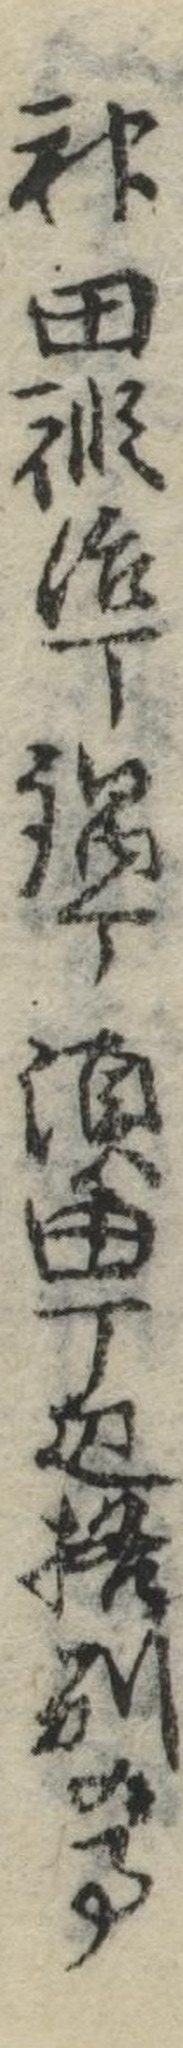神田鍛冶丁鍋丁須田丁辺格別の事
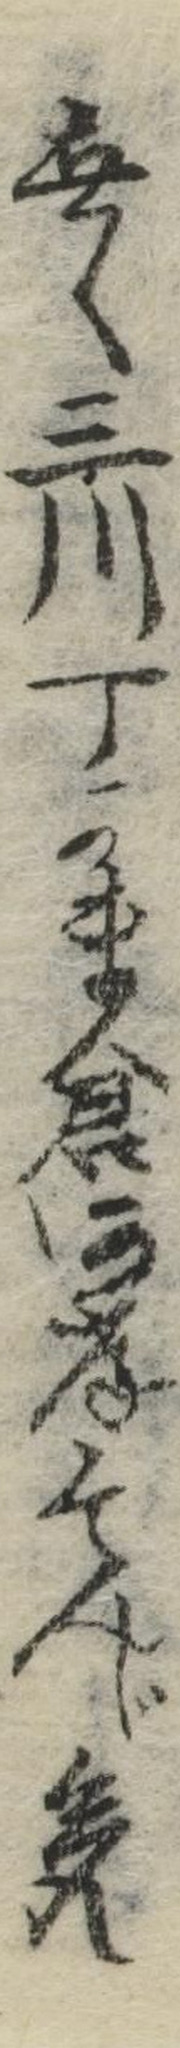無く三川丁かま倉河岸そんじ多し
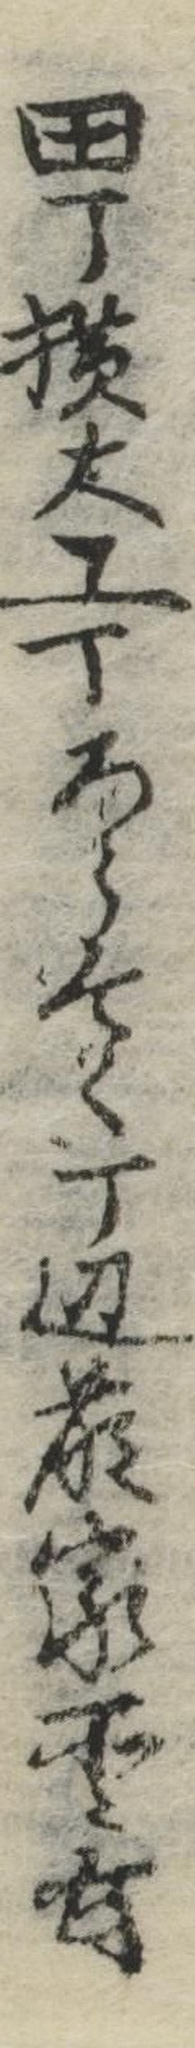田丁横大工丁ろうそく丁辺崩家所々有
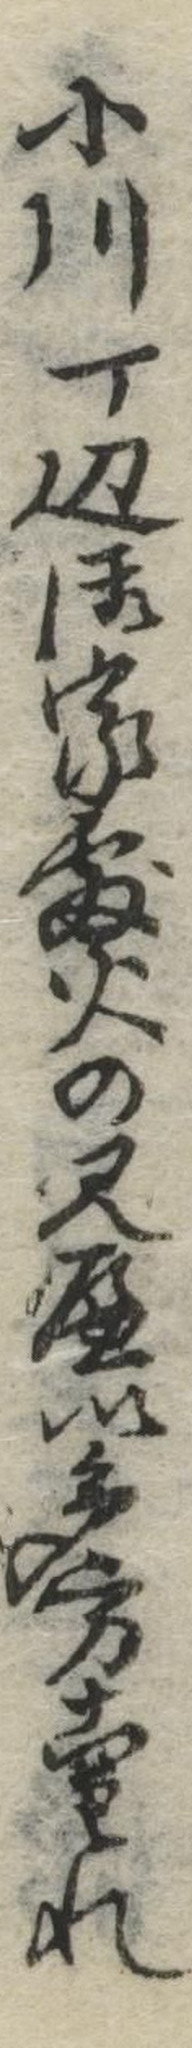小川丁辺御家敷火の見へい多方こわれ
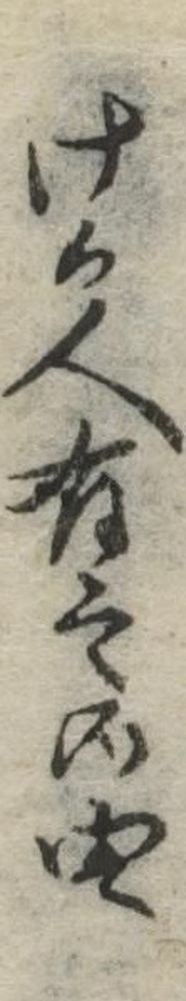ける人有之の由
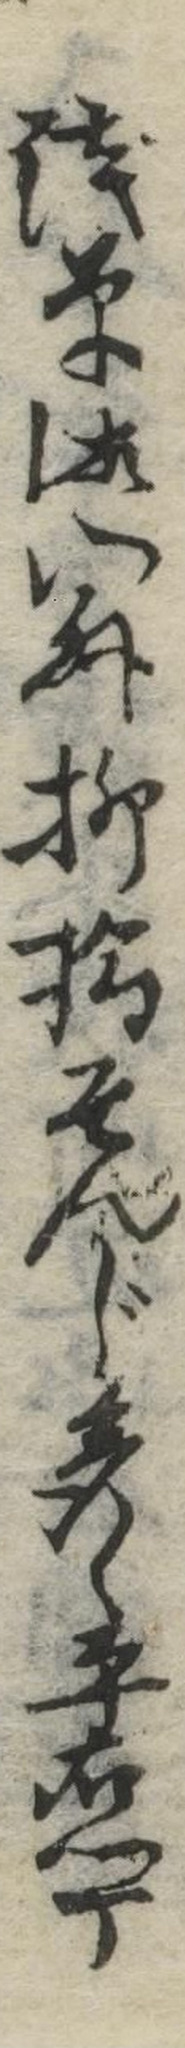浅草御門外柳橋そんじ多く平右衛門丁
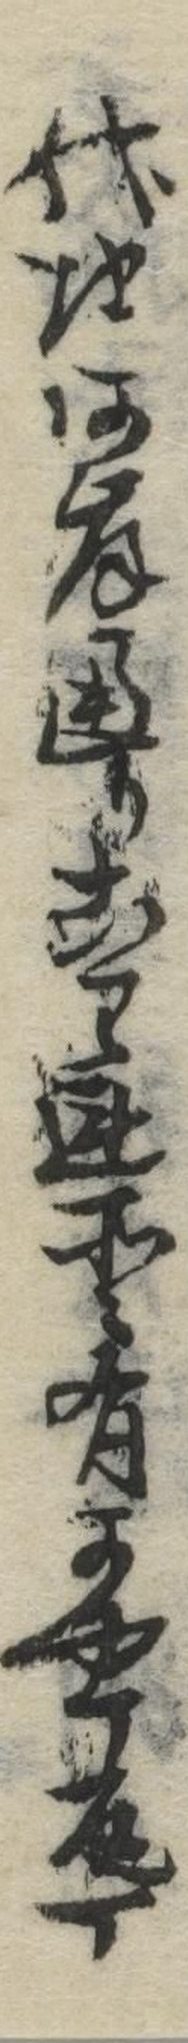代地河岸通りこわれ所〻有かや丁瓦丁
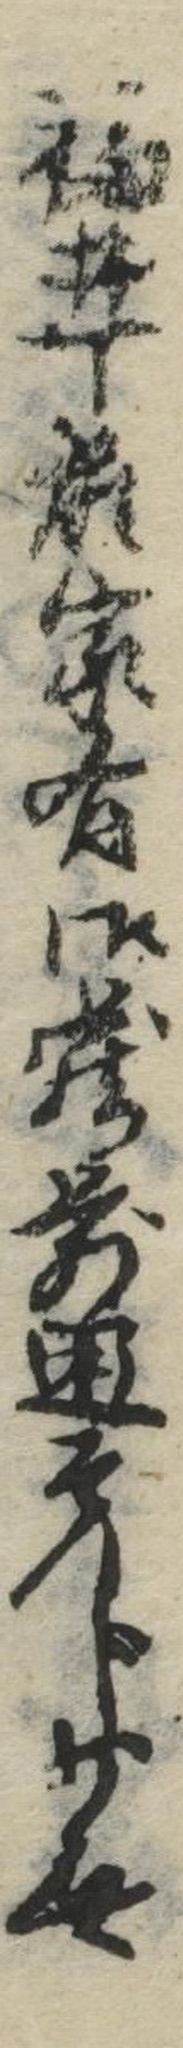福井丁崩家有御蔵前通りそんじ少無
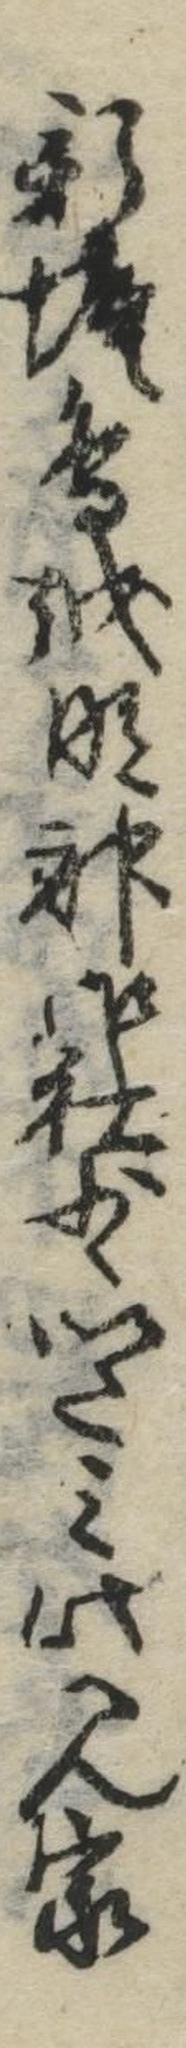新堀鳥越明神御社少ゝいたみ此へん家
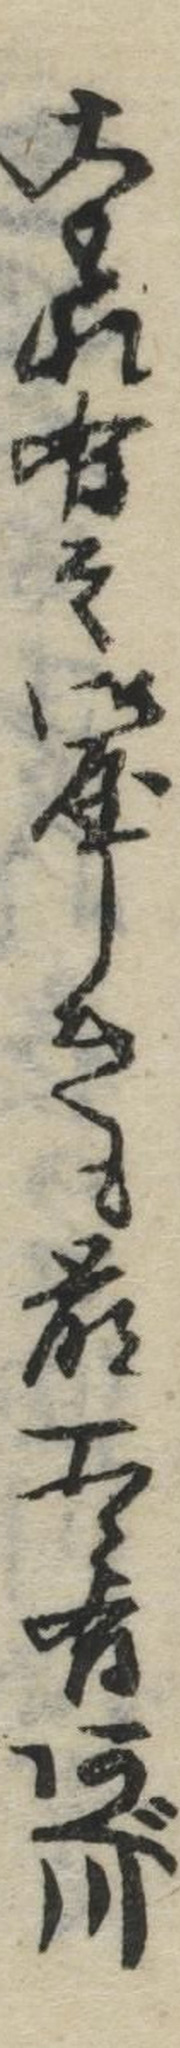こわれ有之御屋しきも崩所〻有あべ川
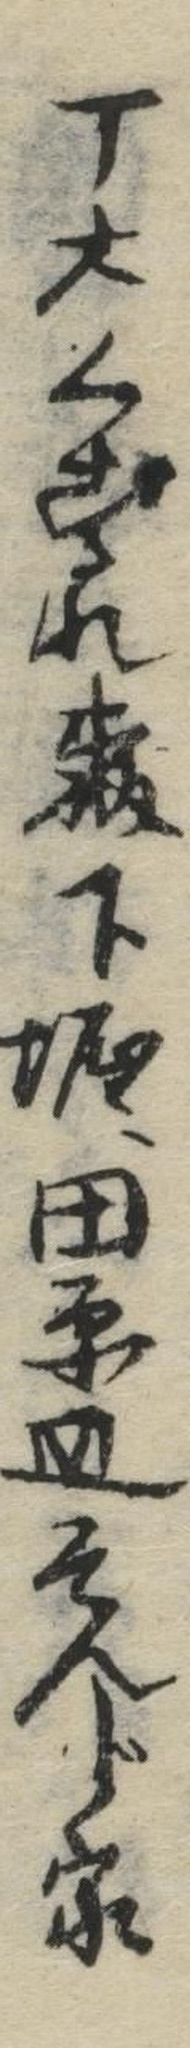丁大くずるれ森下堀田原辺そんじ家
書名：安政三年辰八月廿五日夜　大江都御屋敷方寺社市中共　大嵐水入場所明細書之寫　并街道筋近郷聞書
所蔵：東京大学地震研究所図書室 Earthquake Research Institute Library, The University of Tokyo, JAPAN
